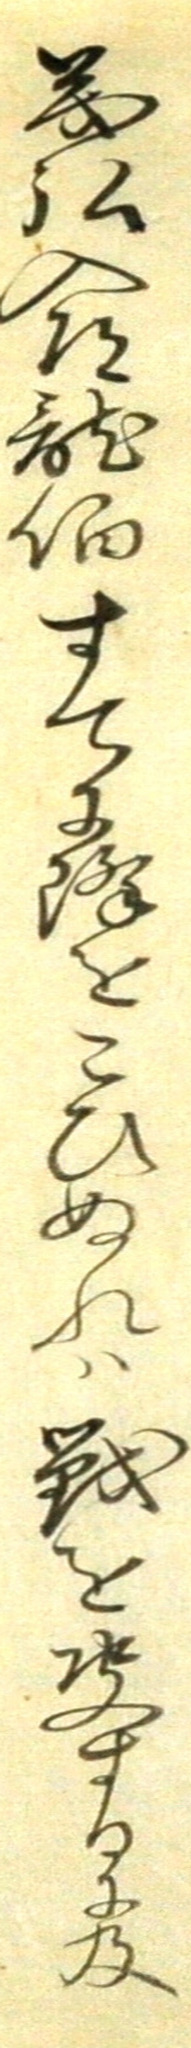義弘入道竜伯すてに降をこひぬれは戦を決するに及
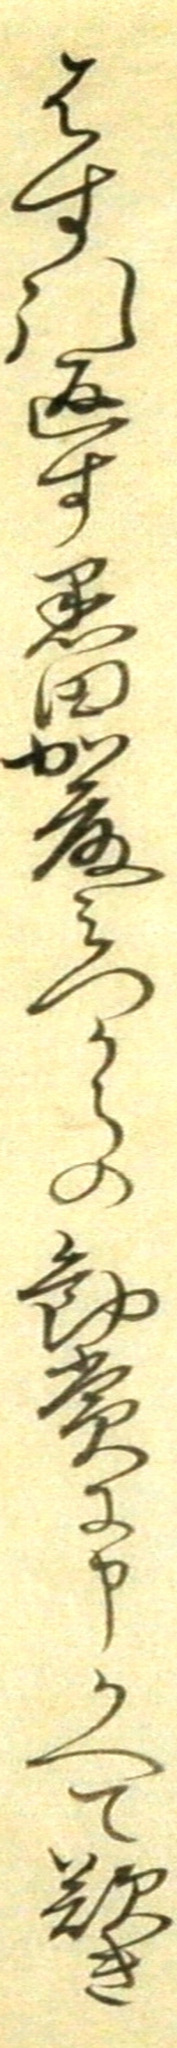はす引返す黒田加藤みつからの勧賞に申かへて歎き
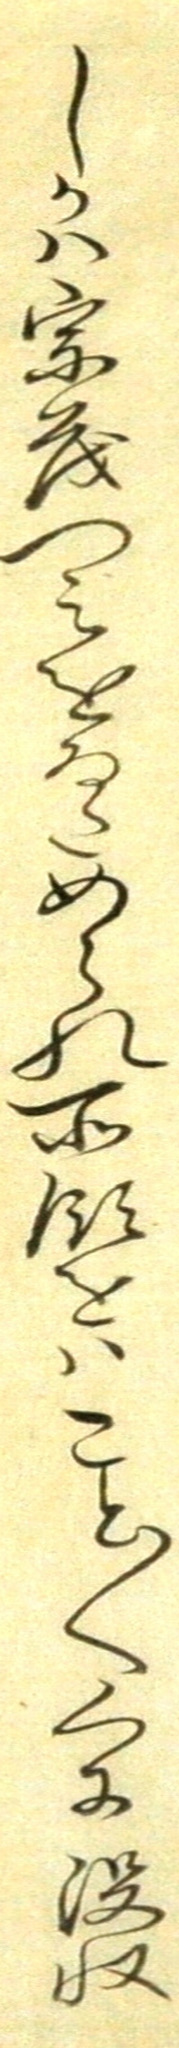しかは宗茂つみをなためられ所領をはこと〳〵くに没収
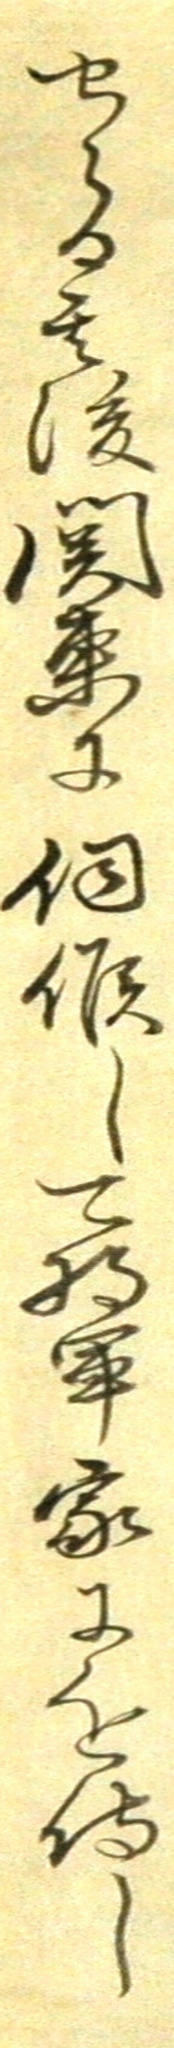せらる其後関東に伺候して将軍家に近侍し

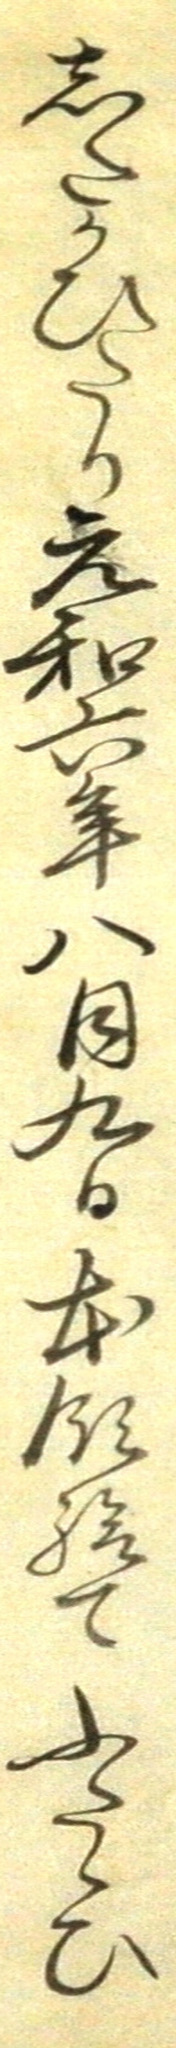したかひたり元和六年八月九日本領給てふたゝひ
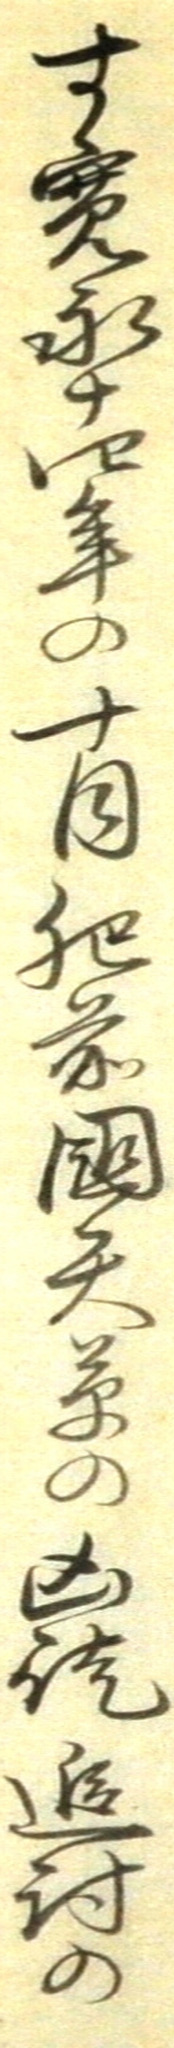す寛永十四年の十月肥前国天草の凶徒追討の
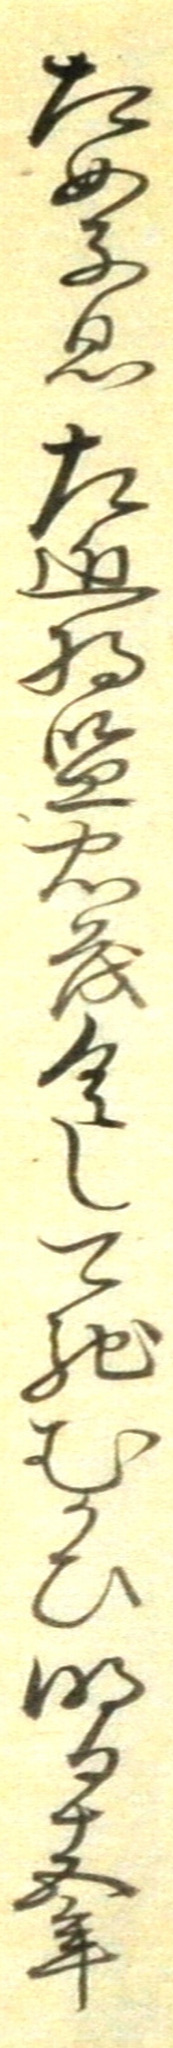ため子息左近将監忠茂具して馳むかひ明る十五年
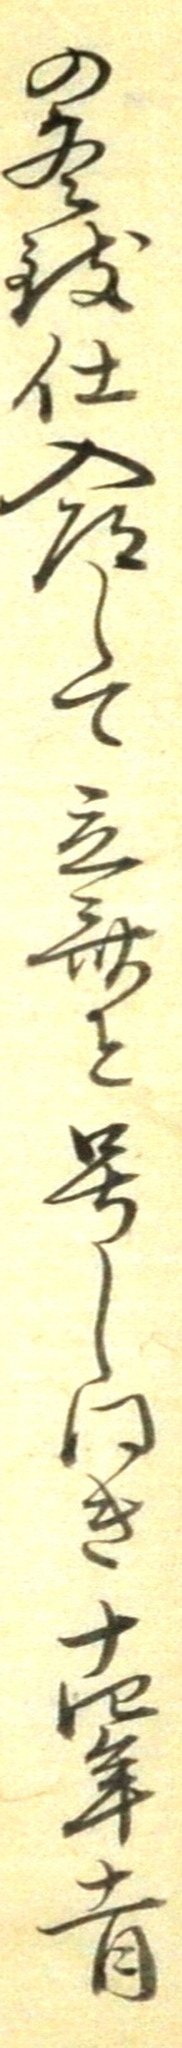の冬致仕入道して立斎と号し同き十四年十一月
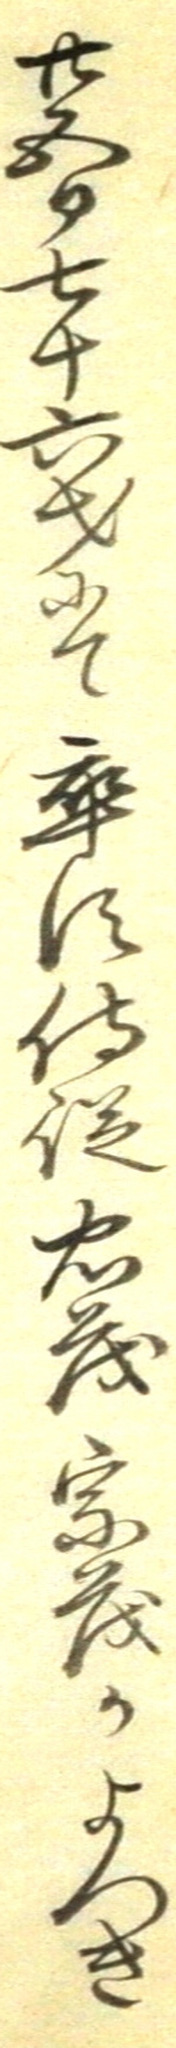廿五日七十六才にて卒す侍従忠茂宗茂かよつき
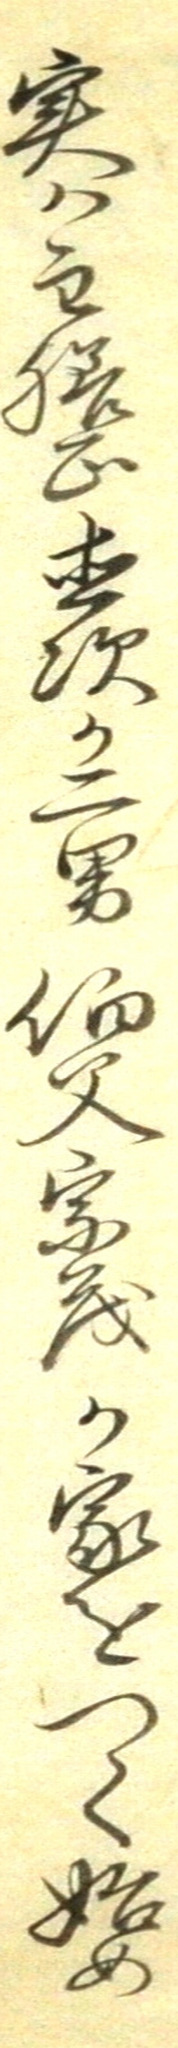実は主膳正直次か二男伯父宗茂か家をつく始め
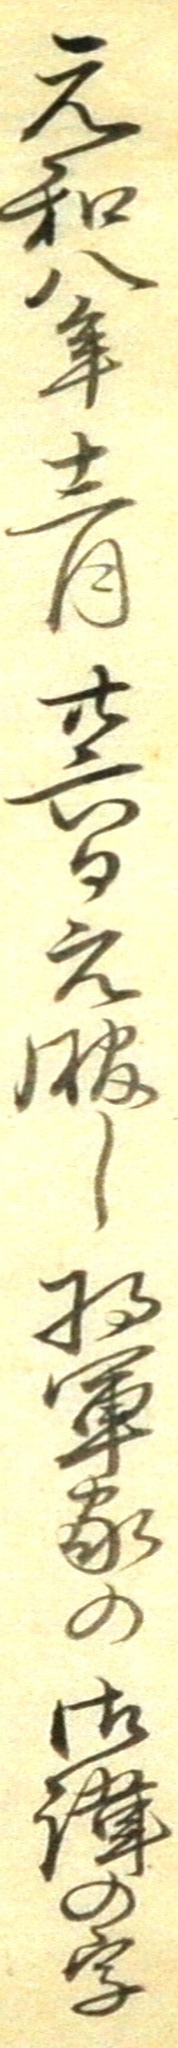元和八年十二月廿六日元服し将軍家の御諱の字
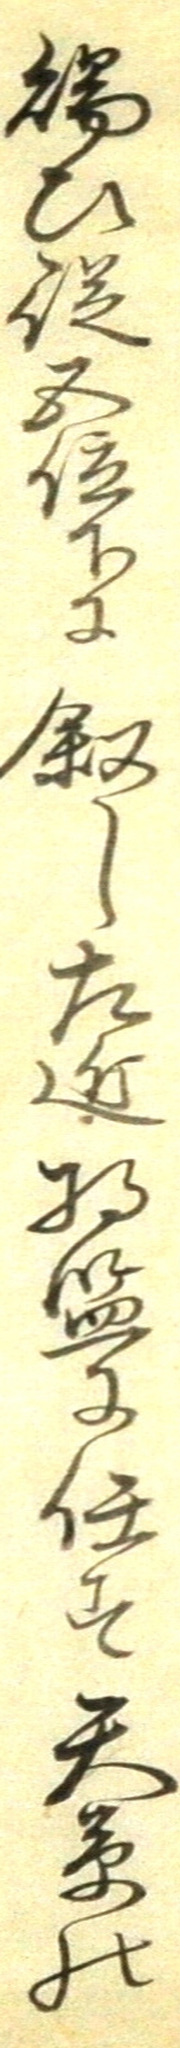賜ひ従五位下に叙し左近将監に任す天草の
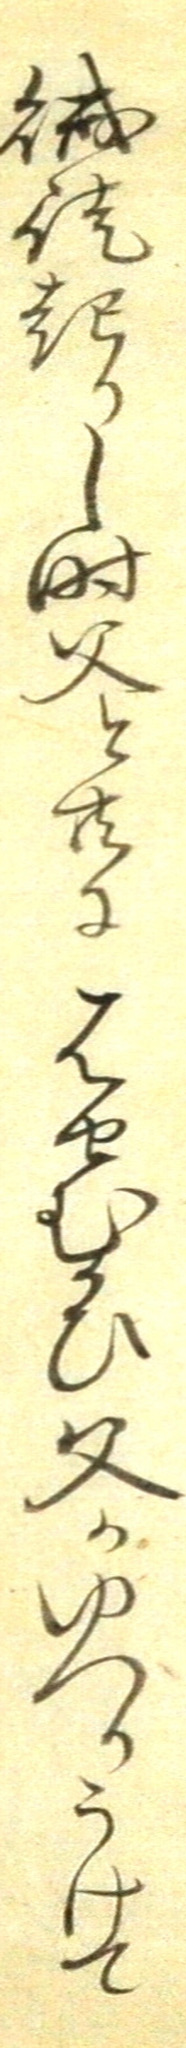賊徒起りし時父と共にはせむかひ父かゆつりうけて
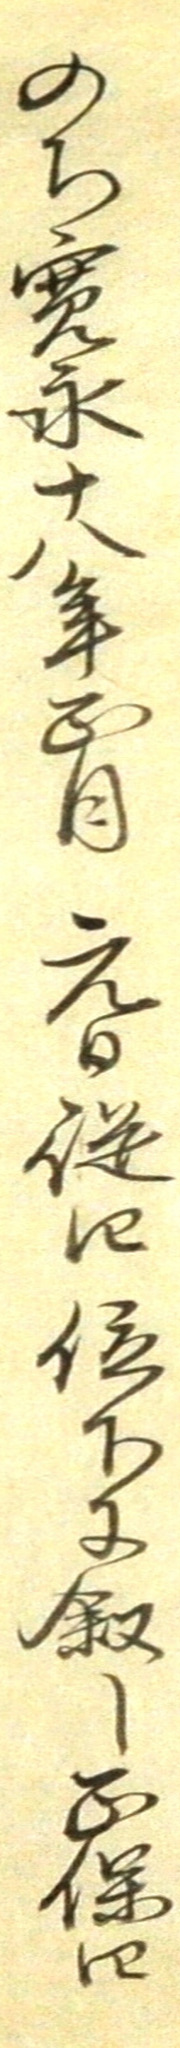のち寛永十八年正月元日従四位下に叙し正保四
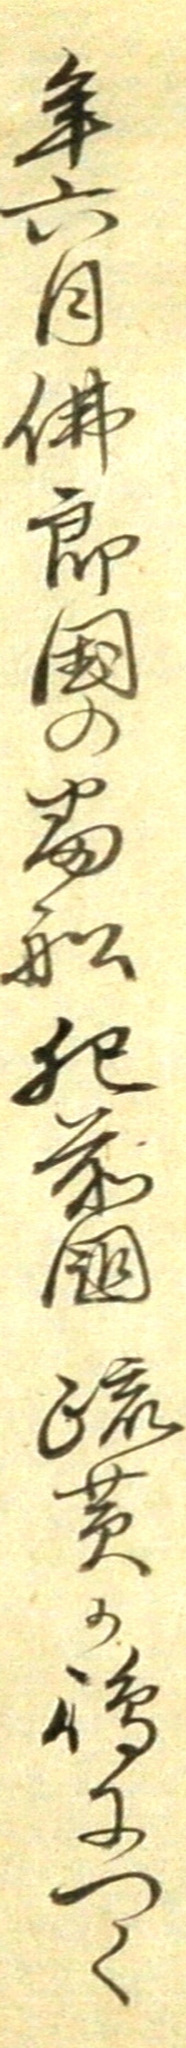年六月仏郎国の番船肥前国疏黄の島につく
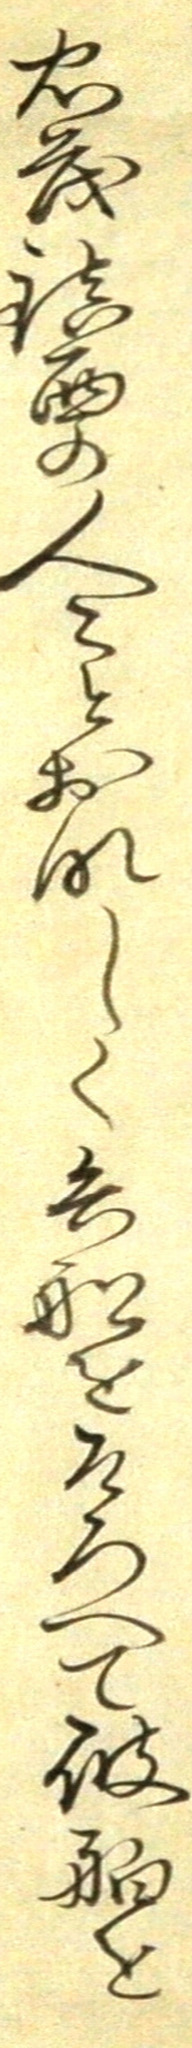忠茂鎮西の人々とおなしく兵船をそろへて彼舶を
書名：藩翰譜（八・下）
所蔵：伊那市立高遠町図書館・合同会社AMANE
